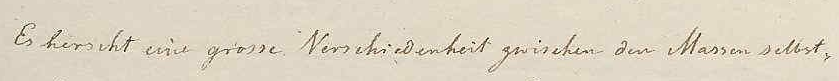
Es herscht eine grosse Verschiedenheit zwischen den Massen selbst,
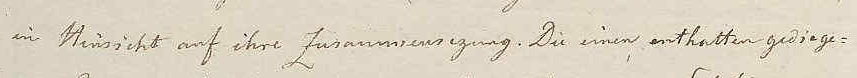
in Hinsicht auf ihre Zusammensezung. Die einen enthalten gediege-
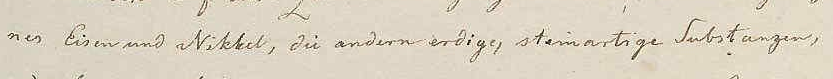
nes Eisen und Nikkel, die andern erdige, steinartige Substanzen,
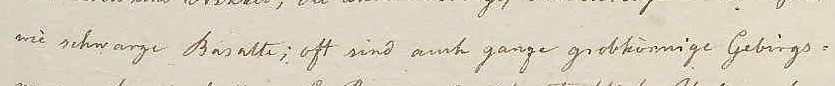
wie schwarze Basalte; oft sind auch ganze grobkörnige Gebirgs-
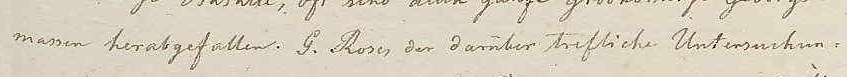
massen herabgefallen. G. Rose, der darüber trefliche Untersuchun-
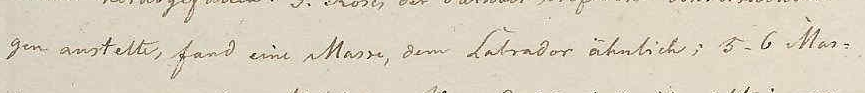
gen anstelte, fand eine Masse, dem Labrador ähnlich; 5–6 Mas-
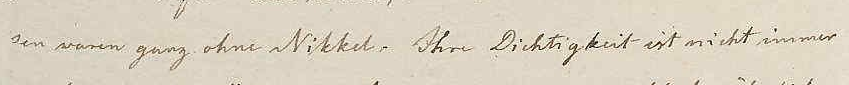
sen waren ganz ohne Nikkel. Ihre Dichtigkeit ist nicht immer
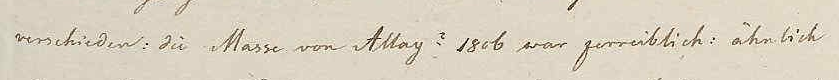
verschieden: die Masse von Allay ? 1806 war zerreiblich: ähnlich
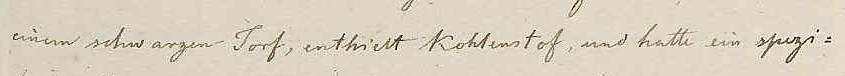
einem schwarzen Torf, enthielt Kohlenstof, und hatte ein spezi-
